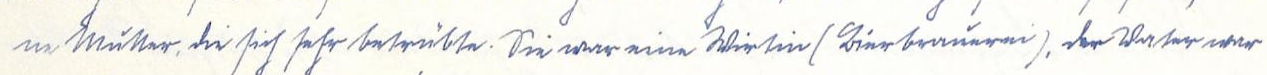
ne Mutter, die sich sehr betrübte. Sie war eine Wirtin (Bierbrauerin), der Vater war
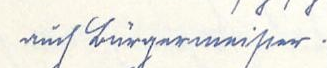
auch Bürgermeister….“
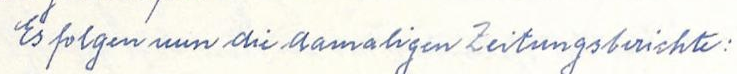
Es folgen nun die damaligen Zeitungsberichte:
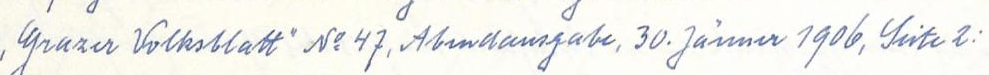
„Grazer Volksblatt“ Nr. 47, Abendausgabe, 30. Jänner 1906, Seite 2:
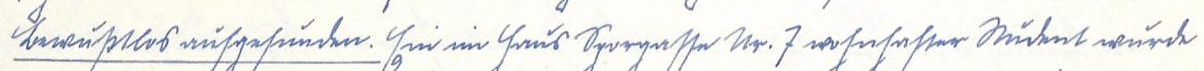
Bewusstlos aufgefunden: Ein im Haus Sporgasse Nr. 7 wohnhafter Student wurde
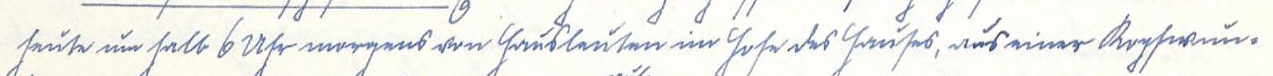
heute um halb 6 Uhr morgens von Hausleuten im Hofe des Hauses, aus einer Kopfwun
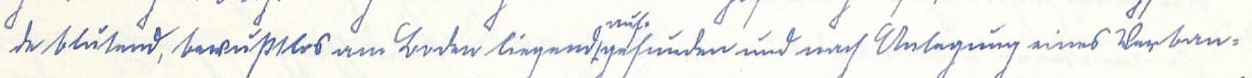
de blutend, bewusstlos am Boden liegend aufgefunden und nach Anlegung eines Verban-
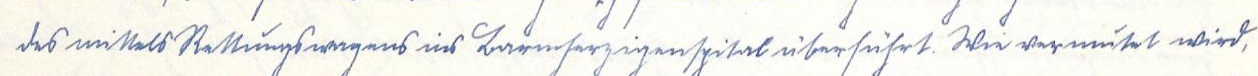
des mittels Rettungswagens ins Barmherzigenspital überführt. Wie vermutet wird,
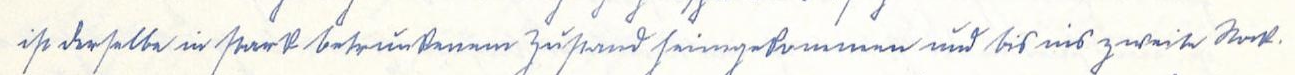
ist derselbe in stark betrunkenem Zustand heimgekommen und bis ins zweite Stock-
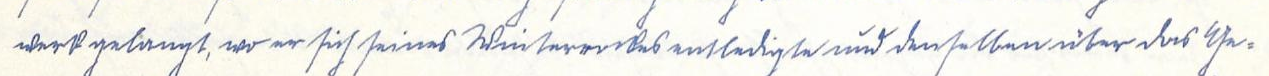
werk gelangt, wo sich seines Winterrockes entledigte und denselben über das Ge-
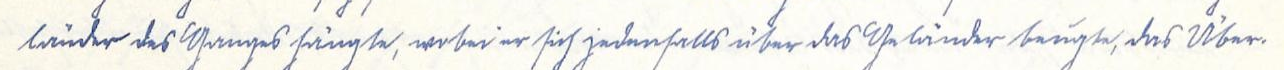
länder des Ganges hängte, wobei er sich jedenfalls über das Geländer hängte, das Über-
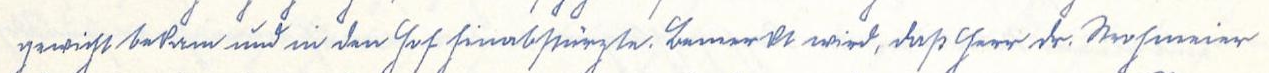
gewicht bekam und in den Hof hinabstürzte. Bemerkt wird, daß Herr Strohmaier
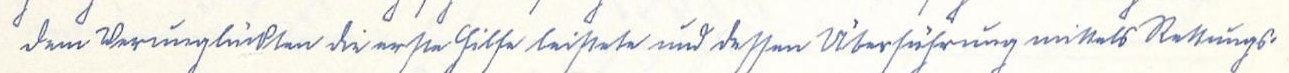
dem Verunglückten die erste Hilfe leistete und dessen Überführung mittels Rettungs-
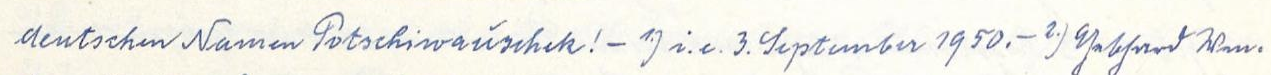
deutschen Namen Potschiwauschek!- 1) i. e. 3. September 1950. 2) Gebhard Wen-
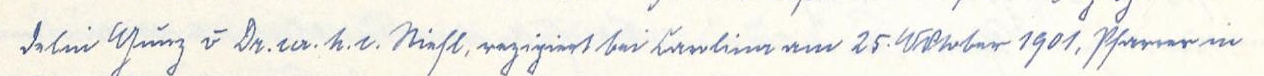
delin Guntz, v/o Dr. cer. h. c. Stiefl, rez. bei Carolina am 25. Oktober 1901. Pfarrer in
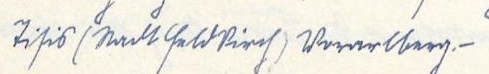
Tisis (Stadt Feldkirch) Vorarlberg.
